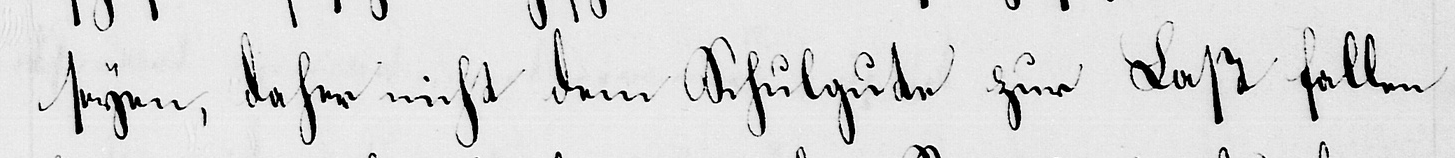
seyen, daher nicht dem Schulgute zur Last fallen
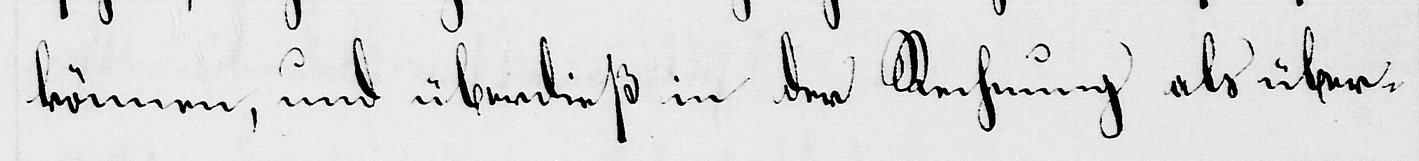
können, und überdieß in der Rechnung als über¬
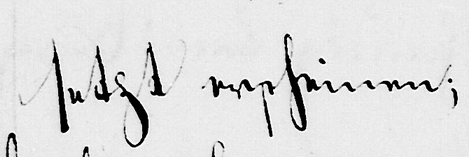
setzt erscheinen;
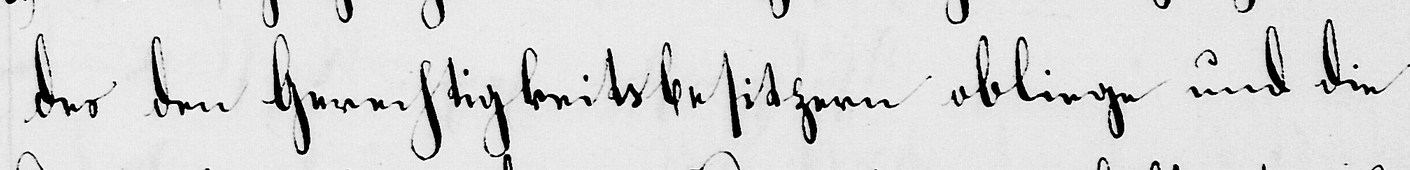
des den Gerechtigkeitsbesitzern obliege und die
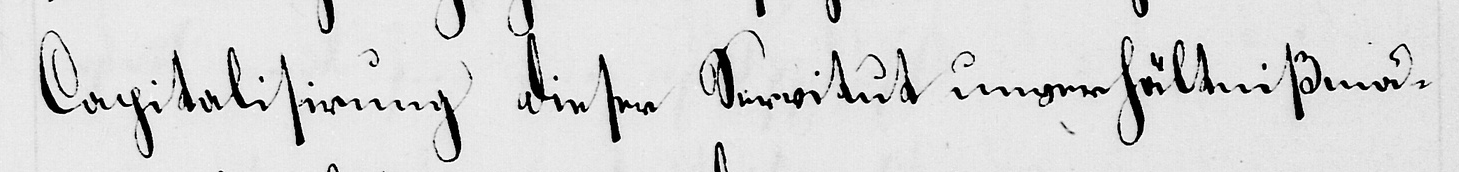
Capitalisirung dieser Servitut unverhältnißmä¬
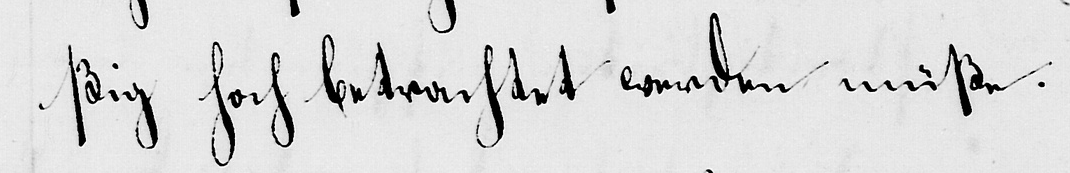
ßig hoch betrachtet werden müße.
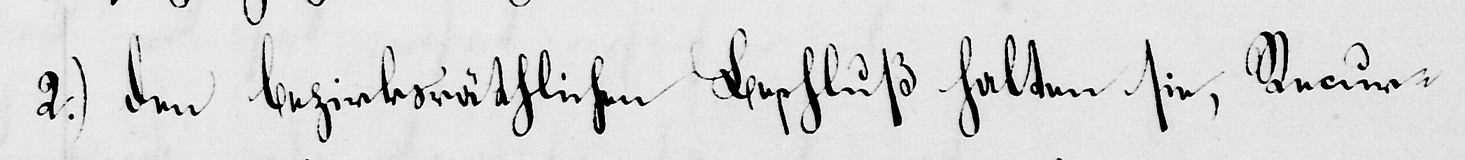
2.) den bezirksräthlichen Beschluß halten sie, Recu¬
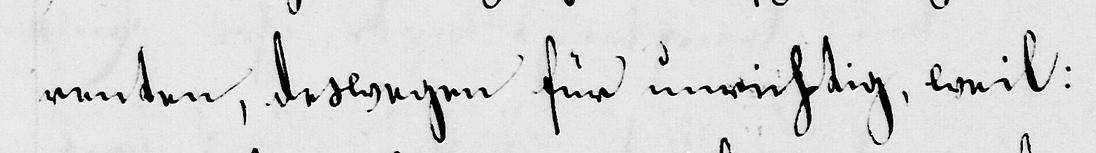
renten, deswegen für unrichtig, weil:
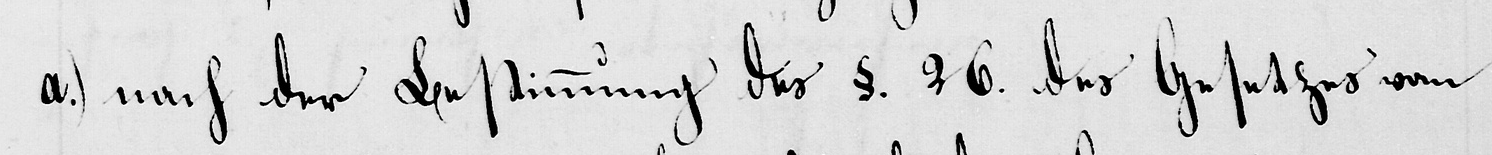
a.) nach der Bestimmung des §. 26. des Gesetzes vom
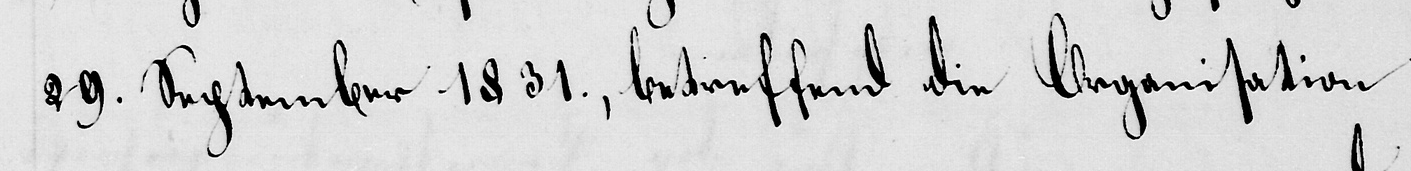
29. September 1831., betreffend die Organisation
